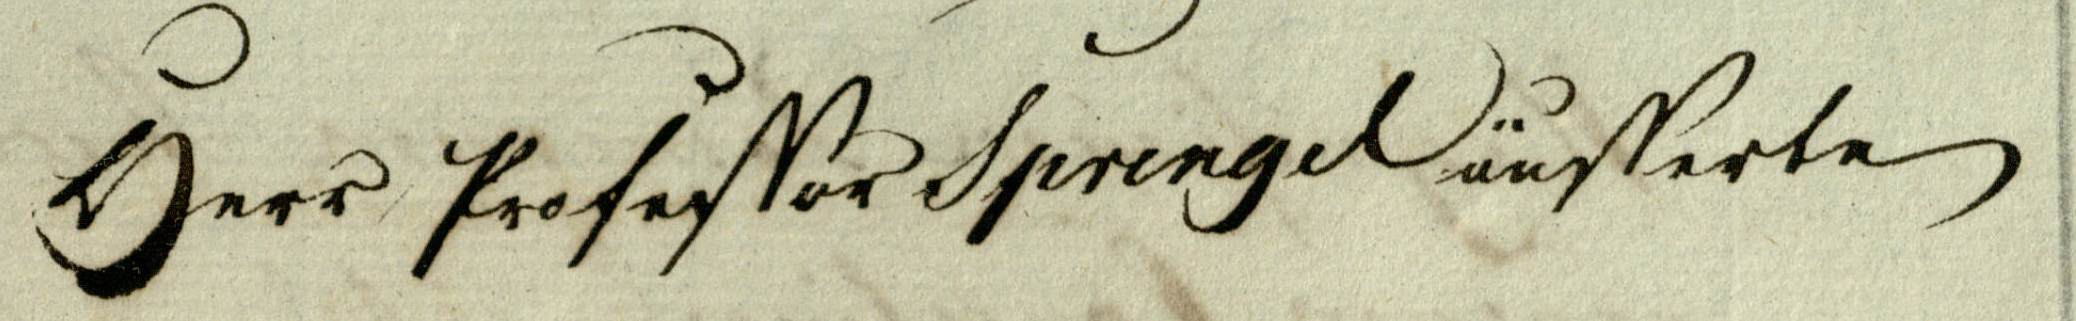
Herr Professor Sprengel äusserte
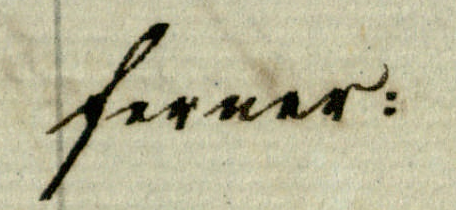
ferner:
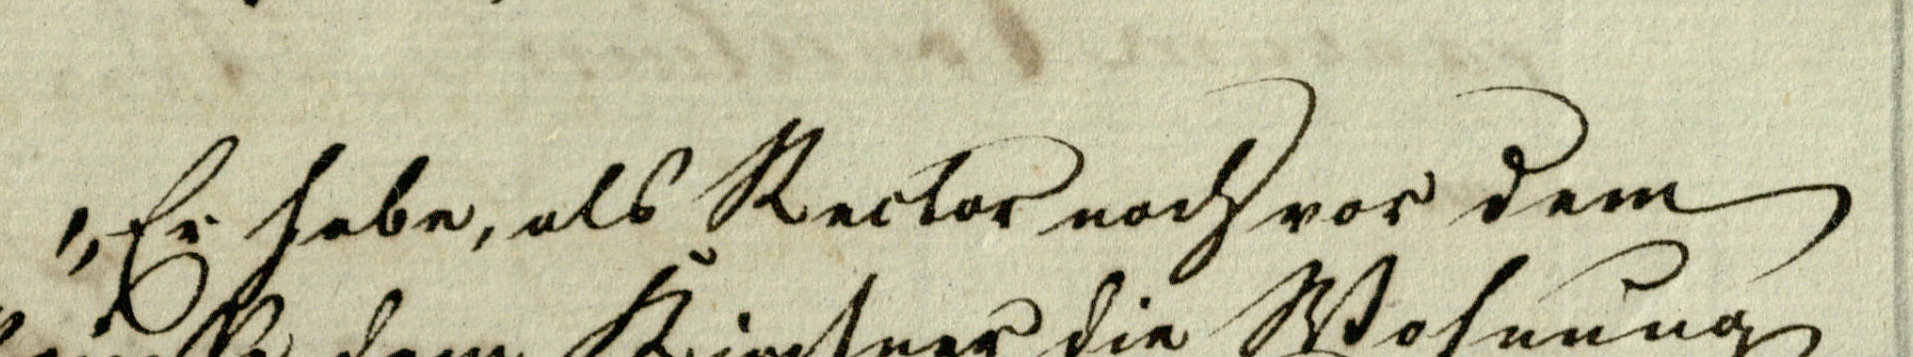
"Er habe, als Rector noch vor dem
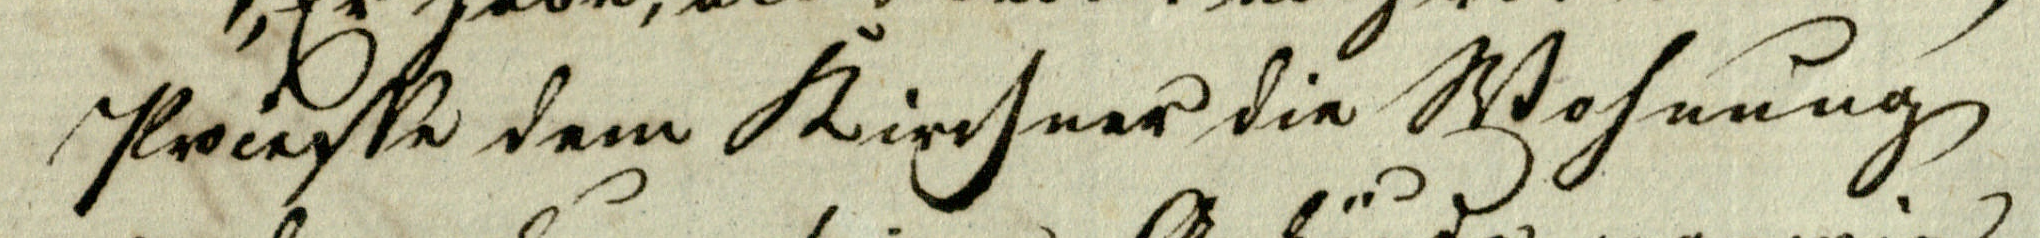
Processe dem Kirchner die Wohnung
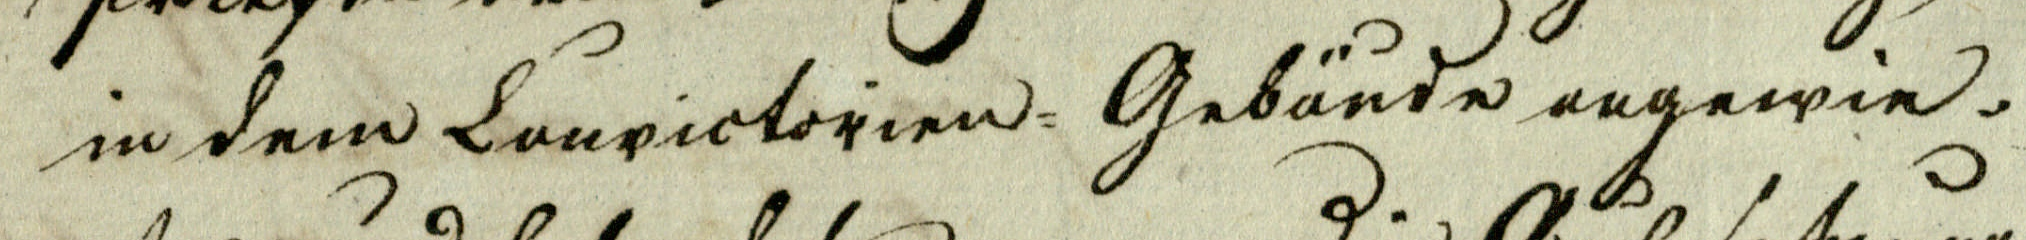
in dem Convictorien-Gebäude angewie¬
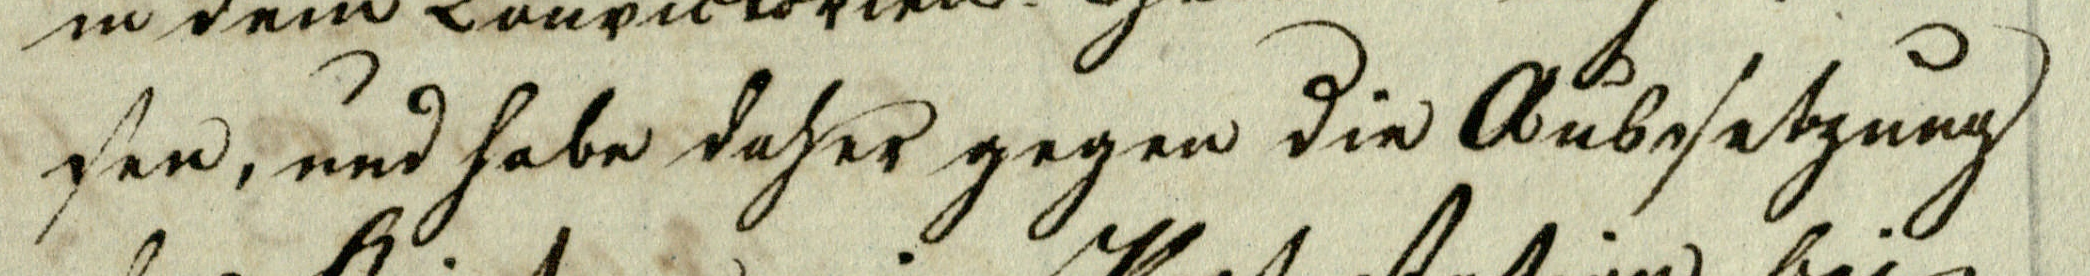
sen, und habe daher gegen die Aussetzung
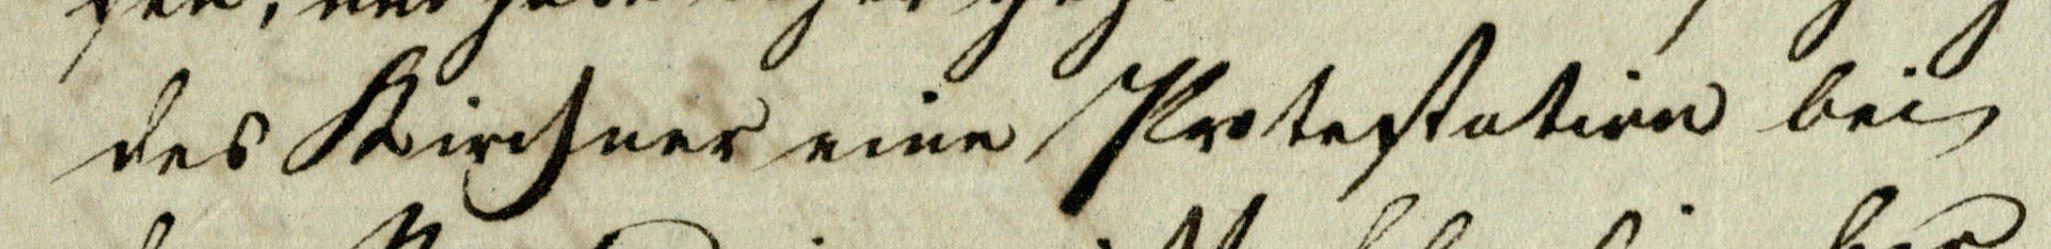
des Kirchner eine Protestation bei
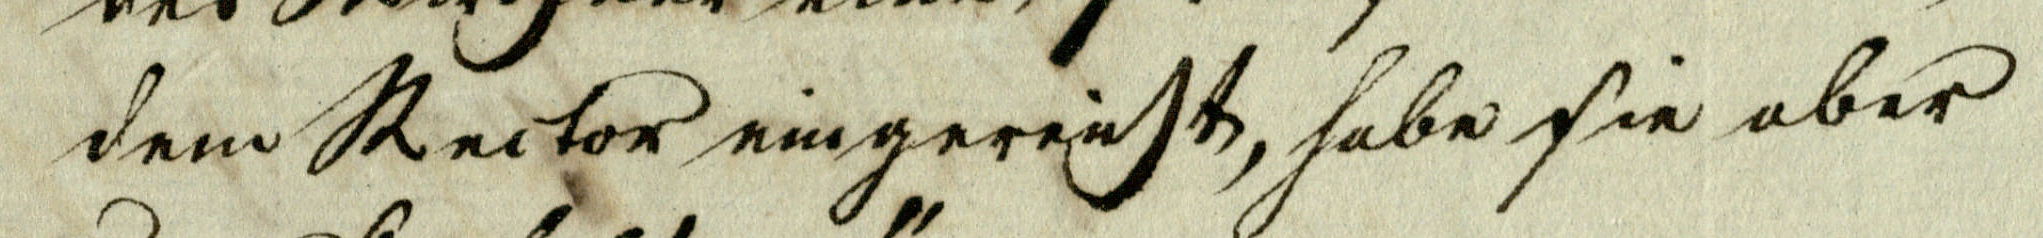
dem Rector eingereicht, habe sie aber
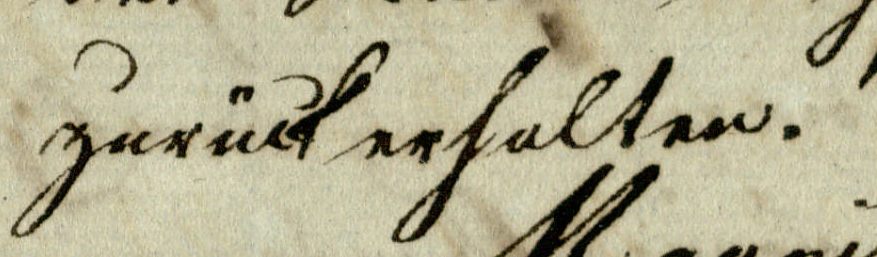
zurück erhalten."
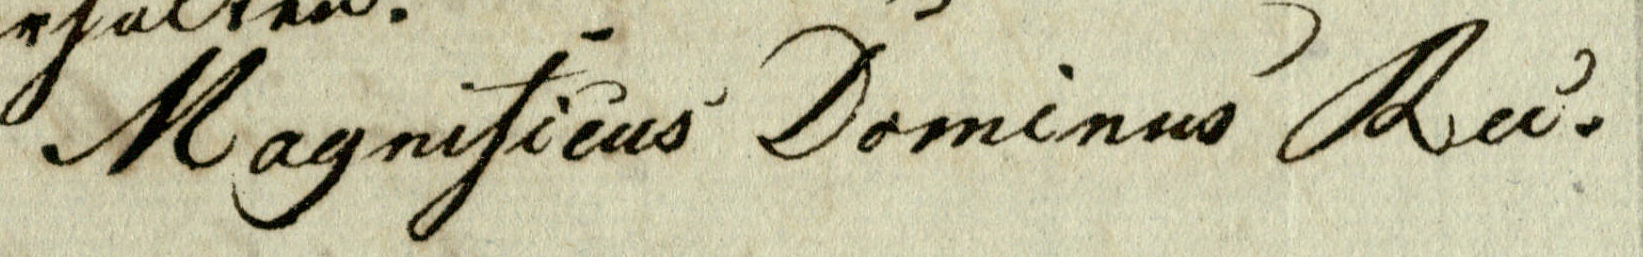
Magnificus Dominus Rec¬
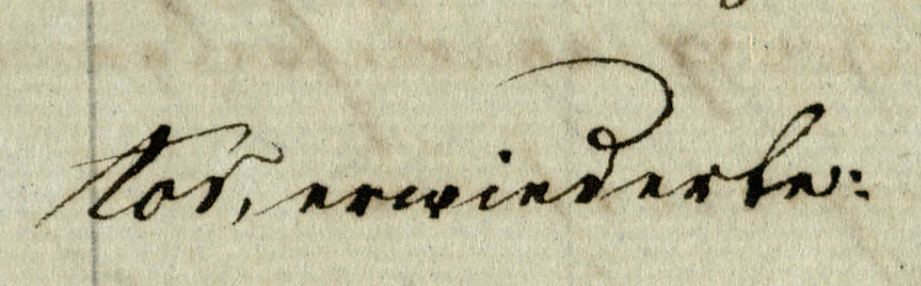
tor, erwiederte:
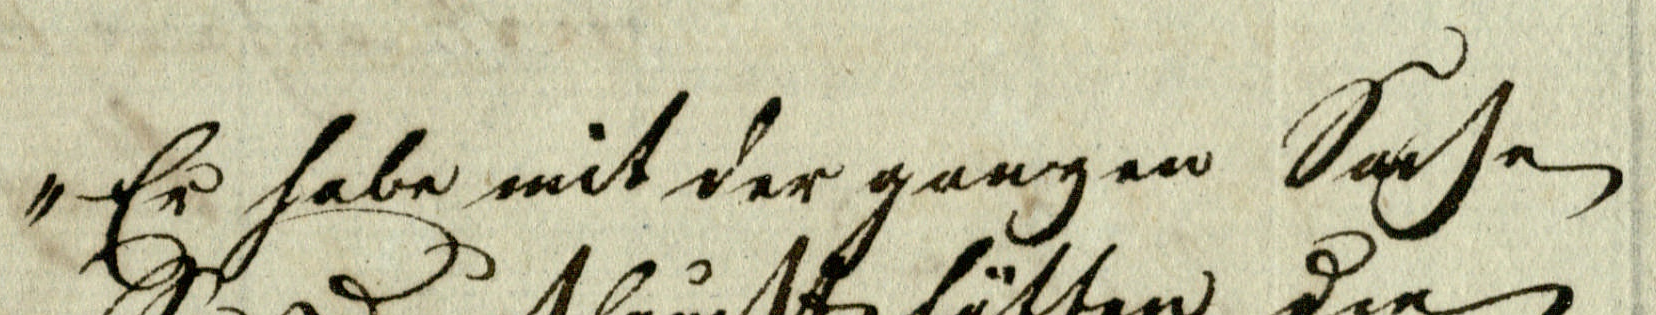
"Er habe mit der ganzen Sache
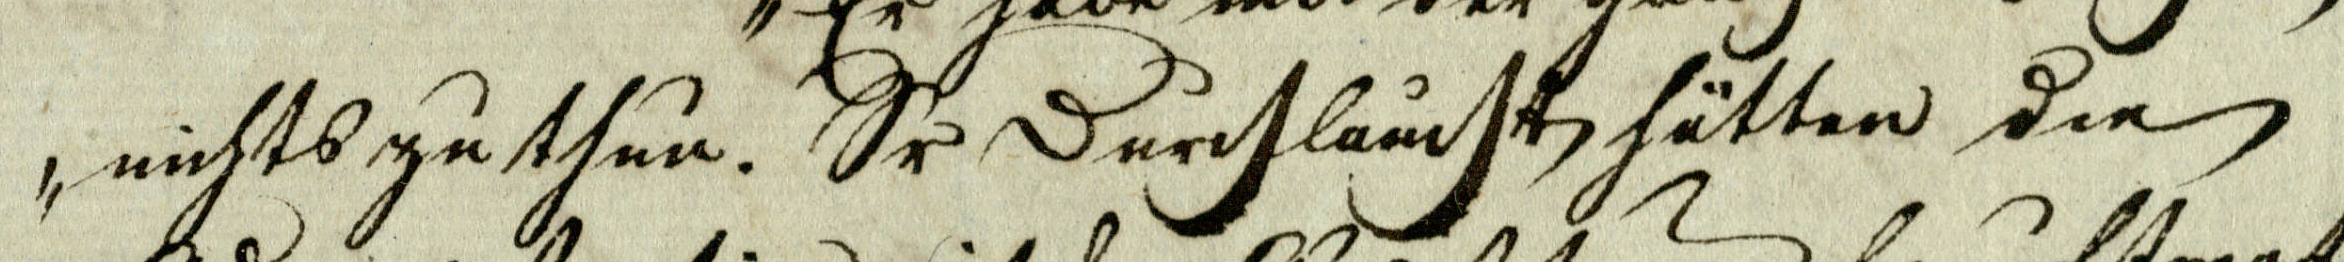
nichts zu thun. Sr Durchlaucht hätten die
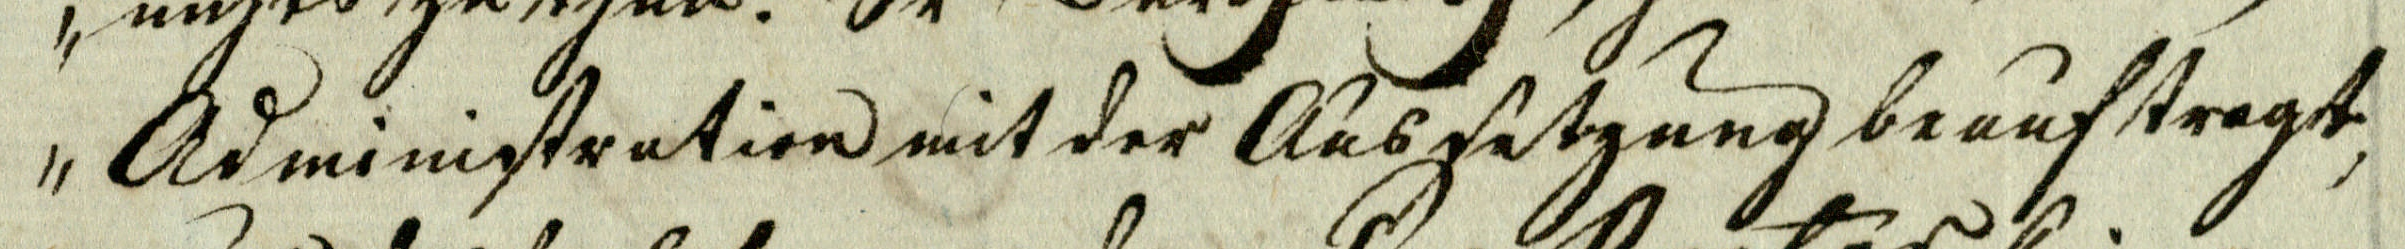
Administration mit der Aussetzung beauftragt,
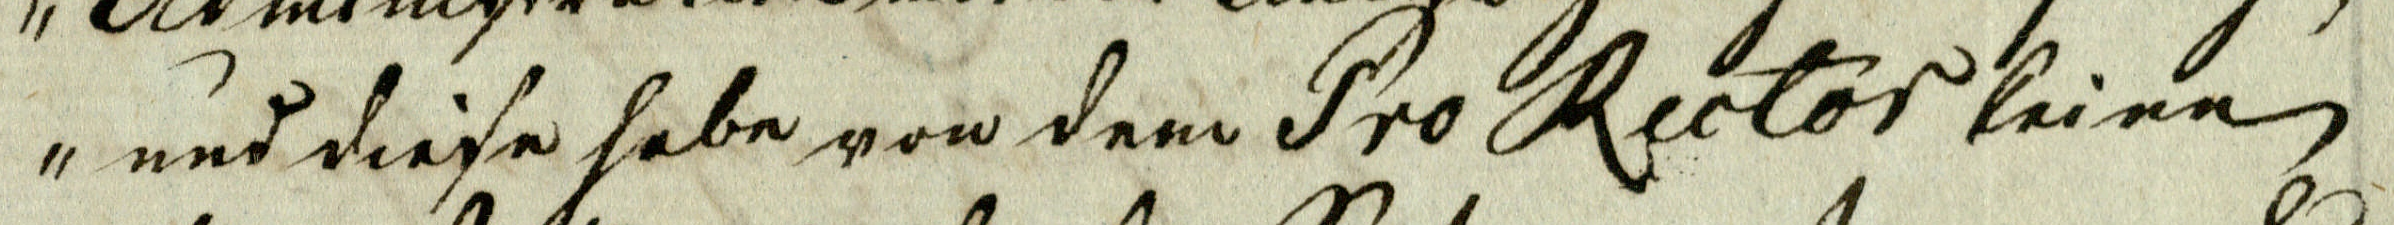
und diese habe von dem Pro Rector keine
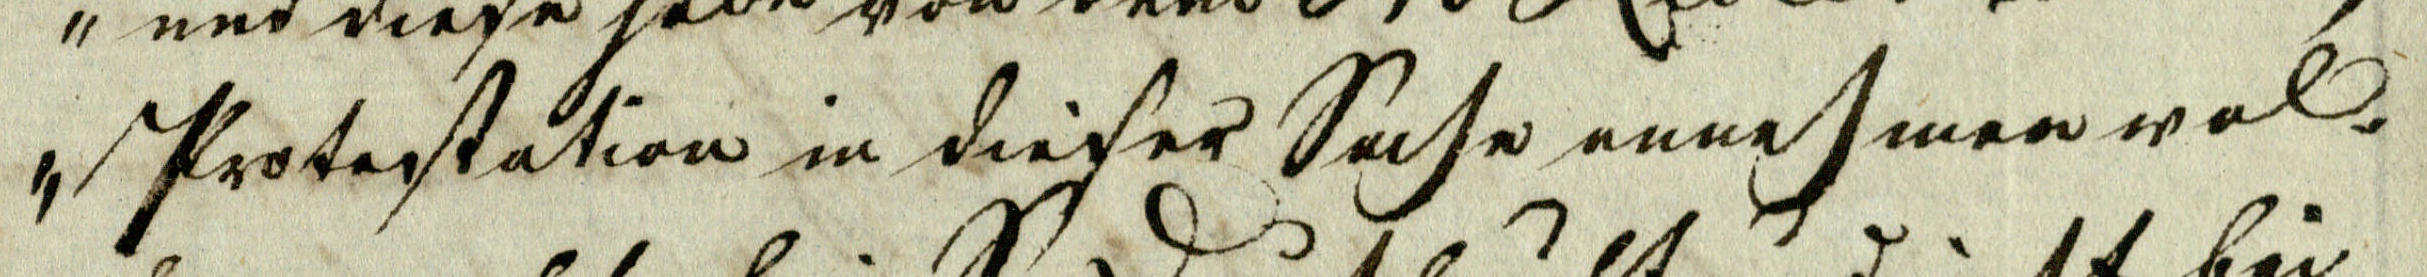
Protestation in dieser Sache annehmen wol¬
